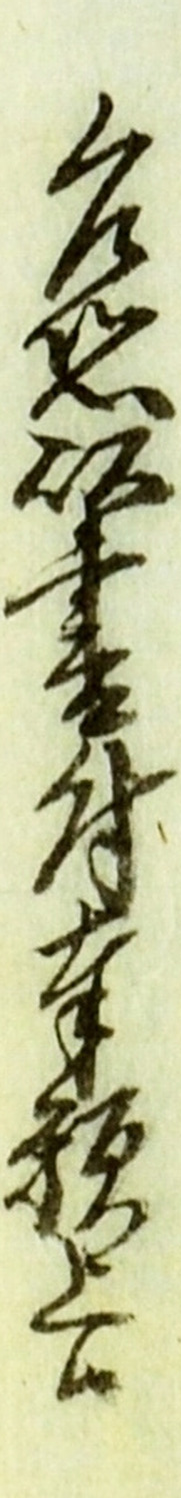乍恐以書付奉願上候
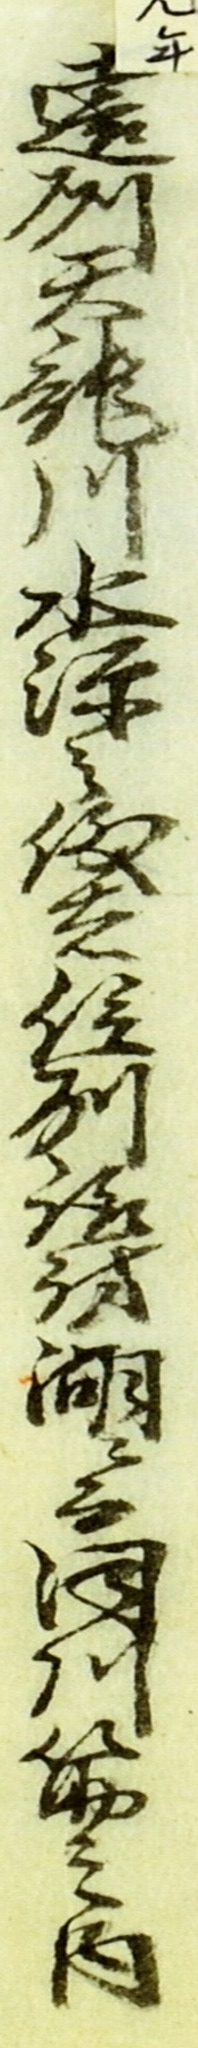遠州天龍川水源之儀者信州諏訪湖ニ而同川筋之内
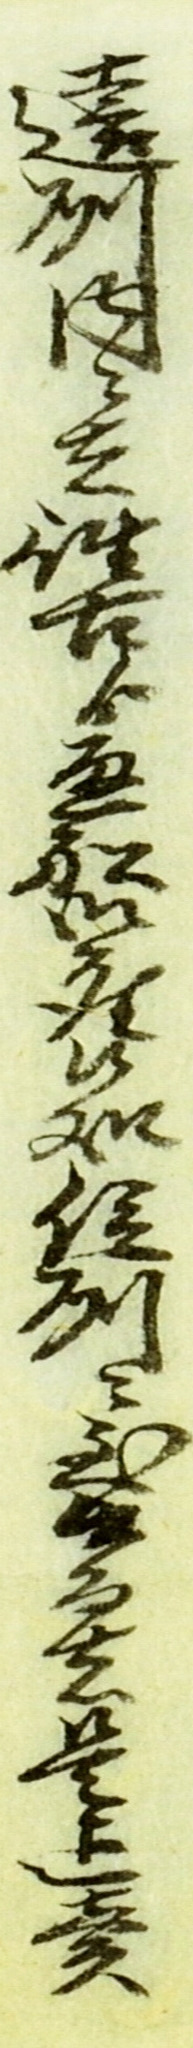遠州内ニ者往古ゟ通船御座候処信州ニ至候而者是迄売
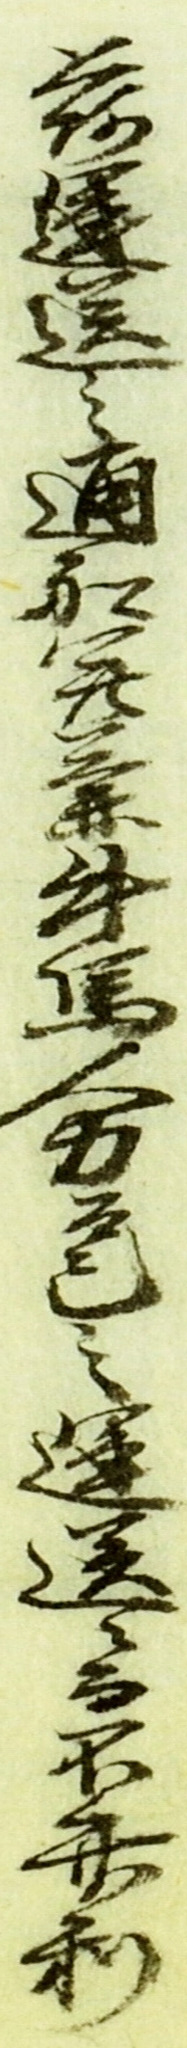荷運送之通船開兼牛馬人力而巳之運送ニ而不弁利
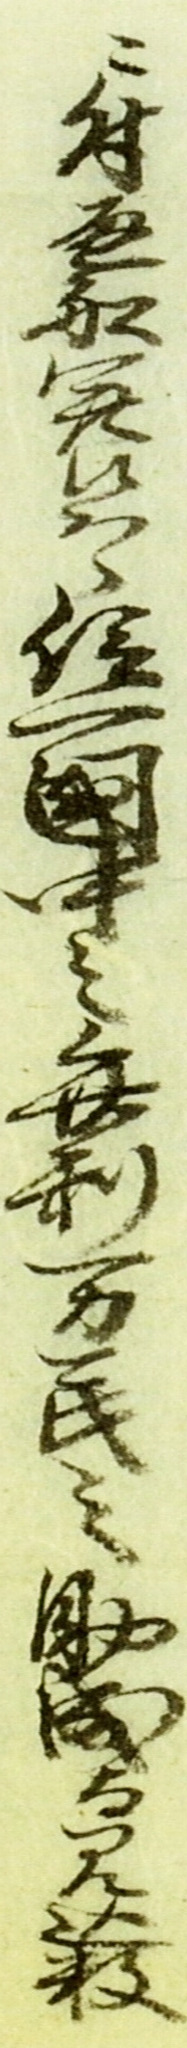ニ付通船開候ハゝ信一国中之弁利万民之助成与見込数
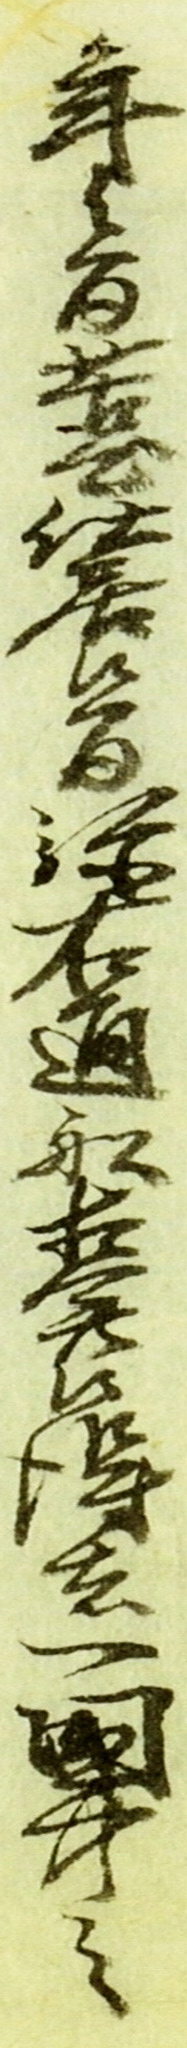年之間苦心仕居候間弥右通船相開候得者一国中之
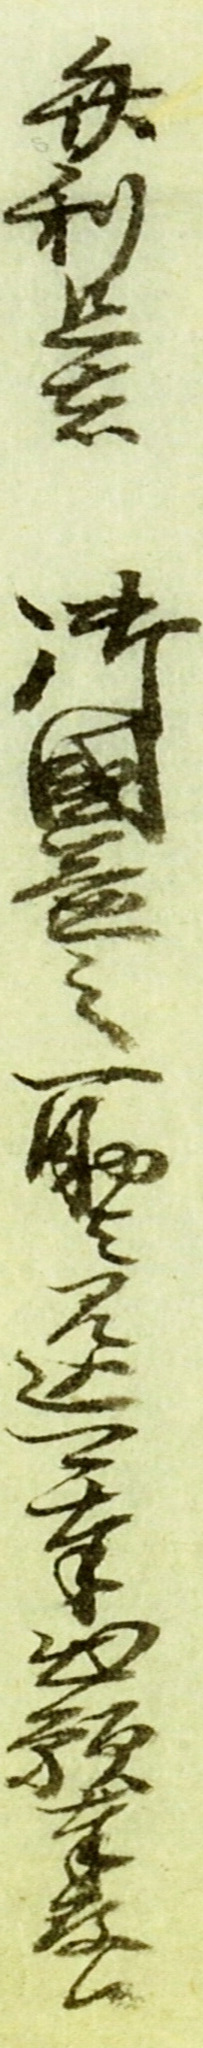弁利且者御国益之一助与見込可奉出願奉存候
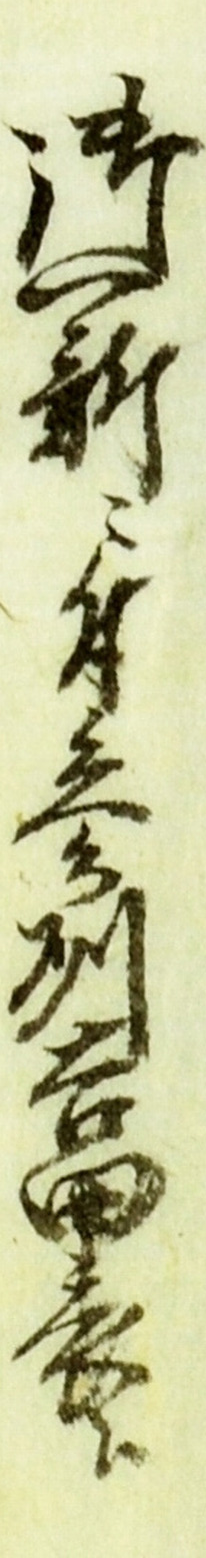御一新ニ付参州吉田表江
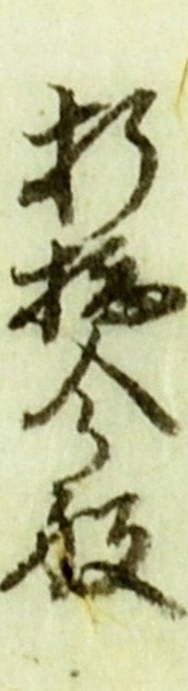折柄今般

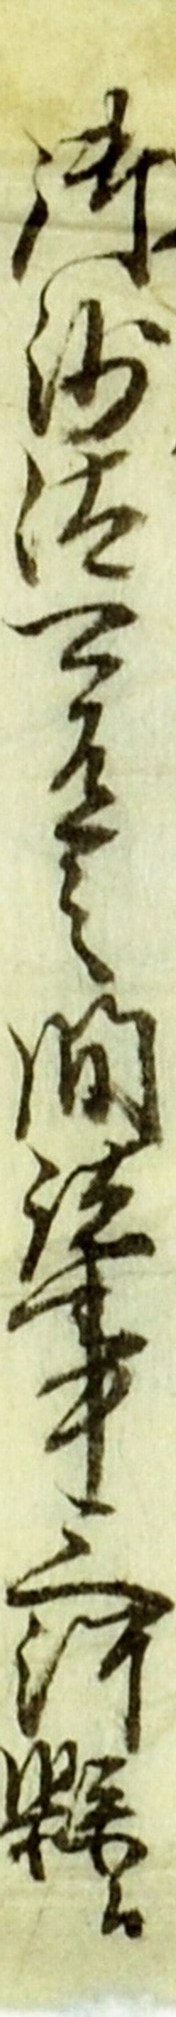御沙汰可有之間諸事三河県江
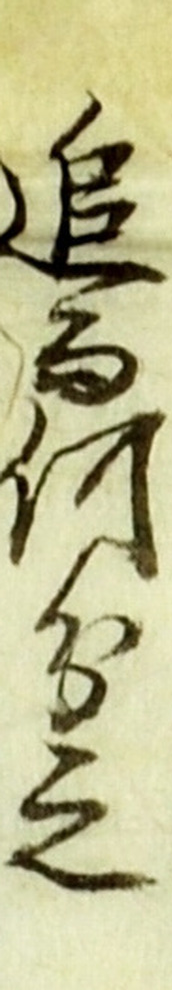追而何分之
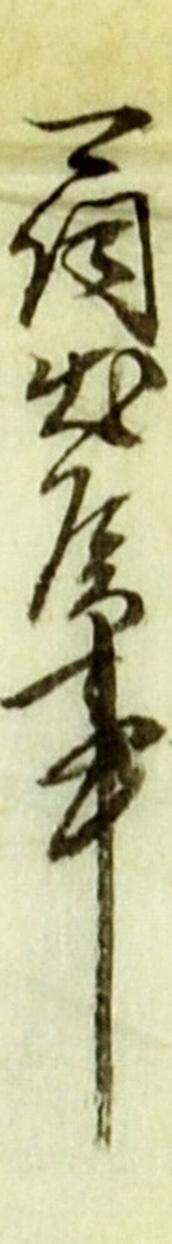可伺出候事

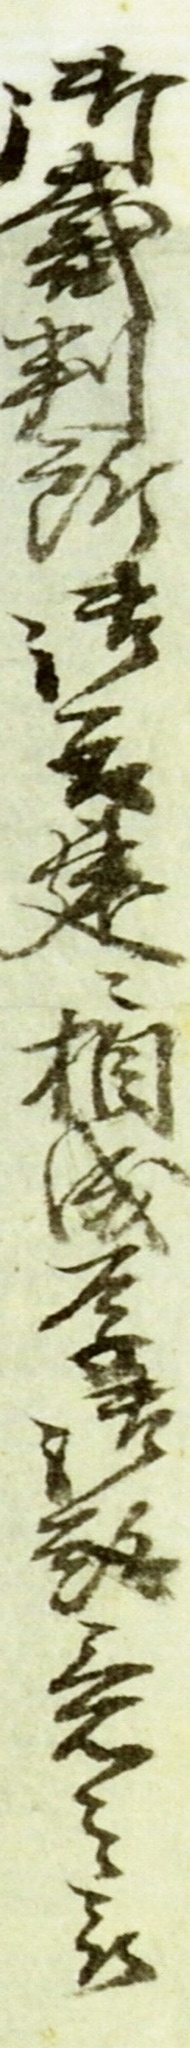御裁判所御取建ニ相成厚御趣意之被
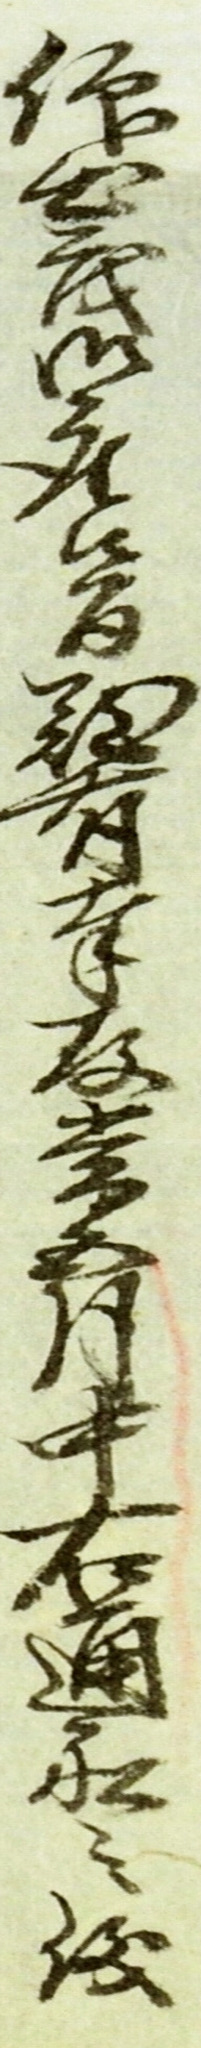仰出茂御座候間難有奉存当五月中右通船之儀
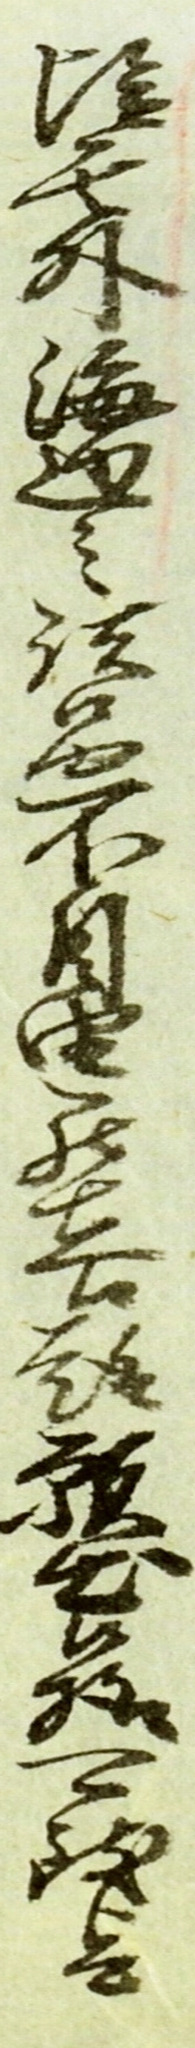塩其外海辺之諸品不自由罷在候趣願出候様可致旨
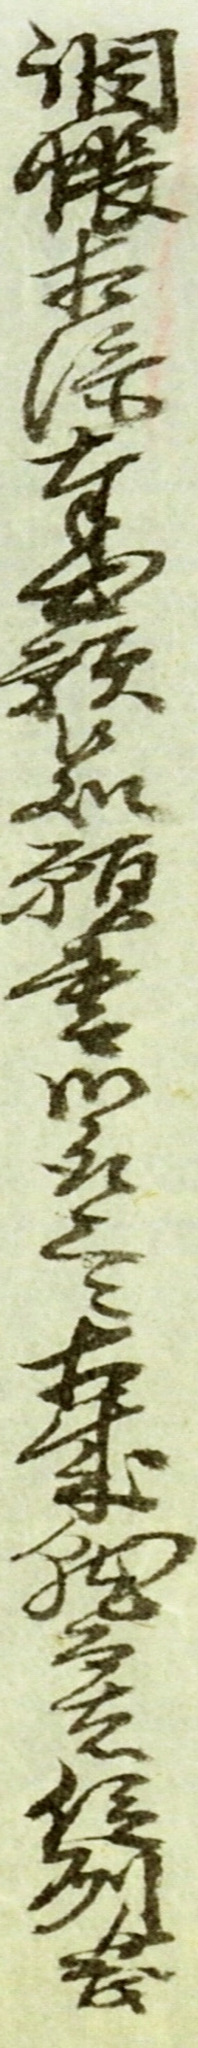調帳相添奉出願候処願書御取上ニ相成就而者信州ゟ茂
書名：乍恐以書付奉願上候
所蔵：伊那市立高遠町図書館・合同会社AMANE
